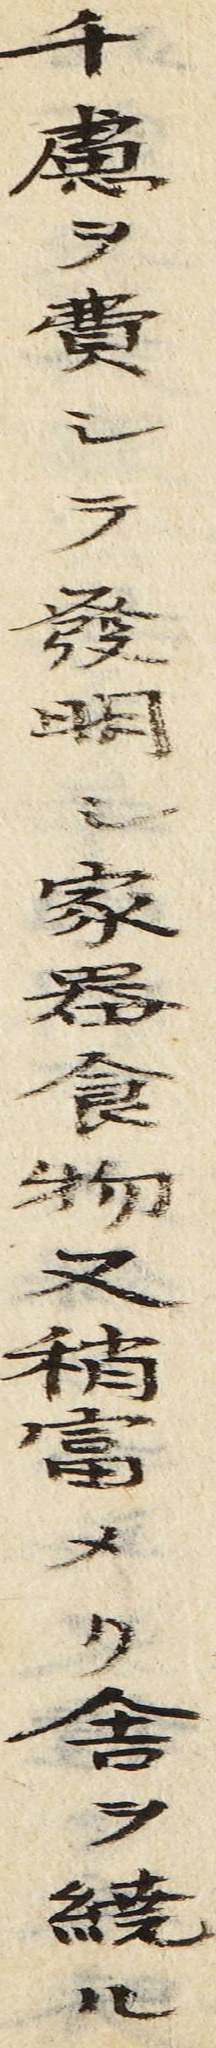千慮ヲ費シテ発明シ家器食物又稍富メリ舎ヲ繞ル
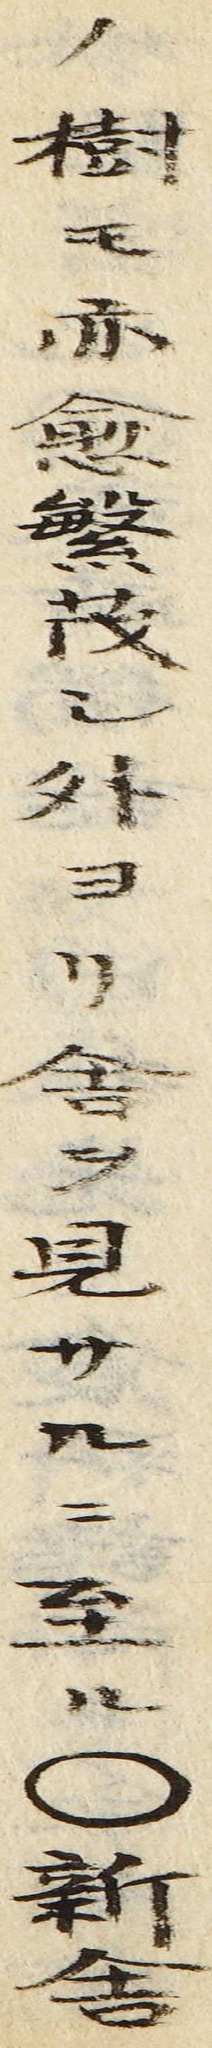ノ樹モ亦愈繁茂シ外ヨリ舎ヲ見サルニ至ル◯新舎
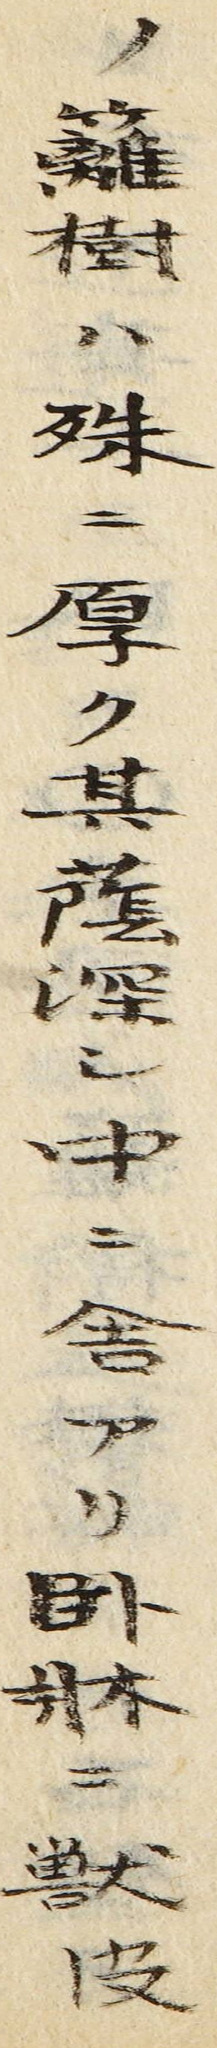ノ籬樹ハ殊ニ厚ク其蔭深シ中ニ舎アリ臥牀ニ獣皮

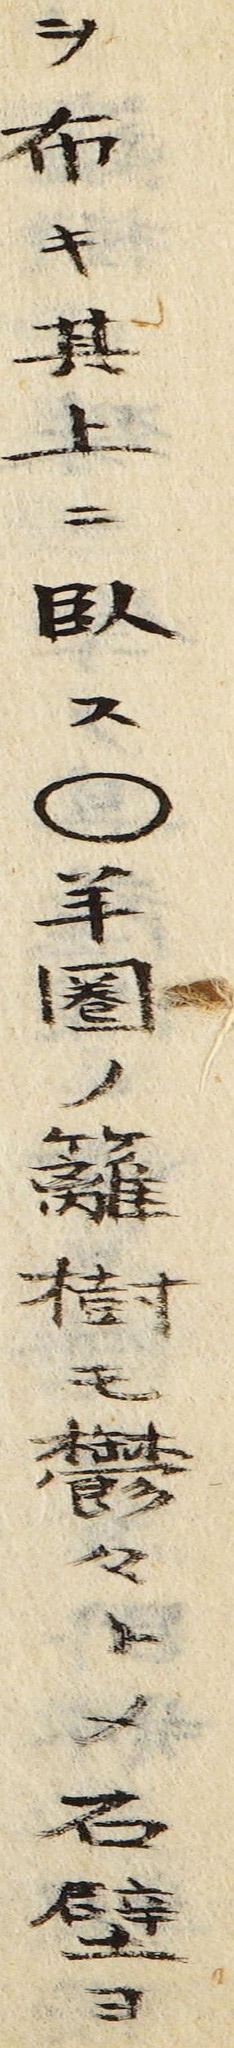ヲ布キ其上ニ臥ス◯羊圏ノ籬樹モ鬱々トシテ石壁ヨ
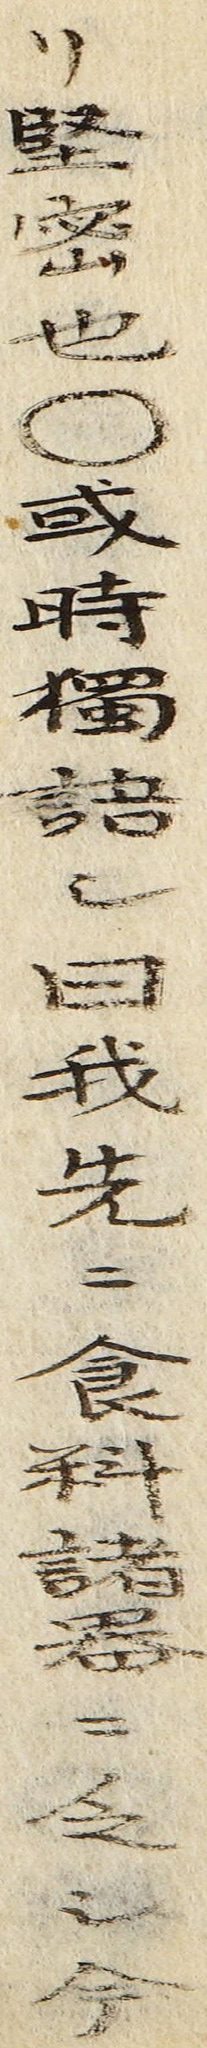リ堅密也◯或時独語シ曰我先ニ食料諸器ニ乏シ今
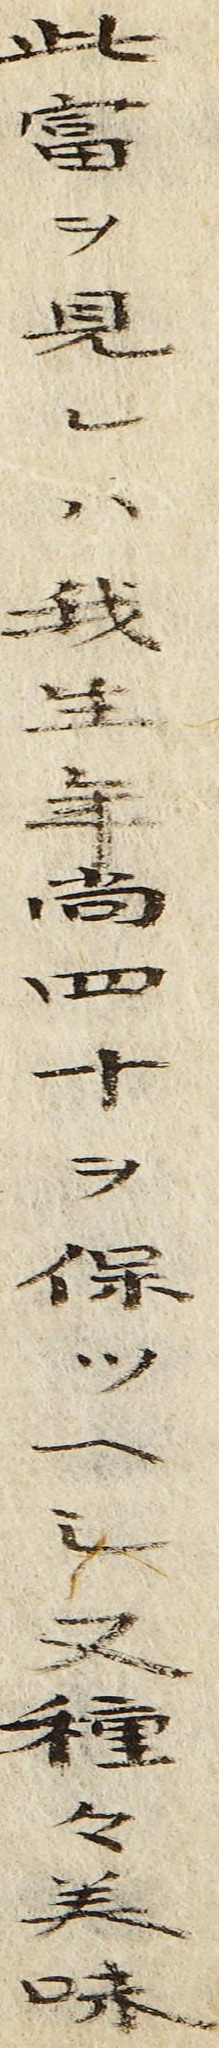此富ヲ見レハ我生年尚四十ヲ保ツヘシ又種々美味
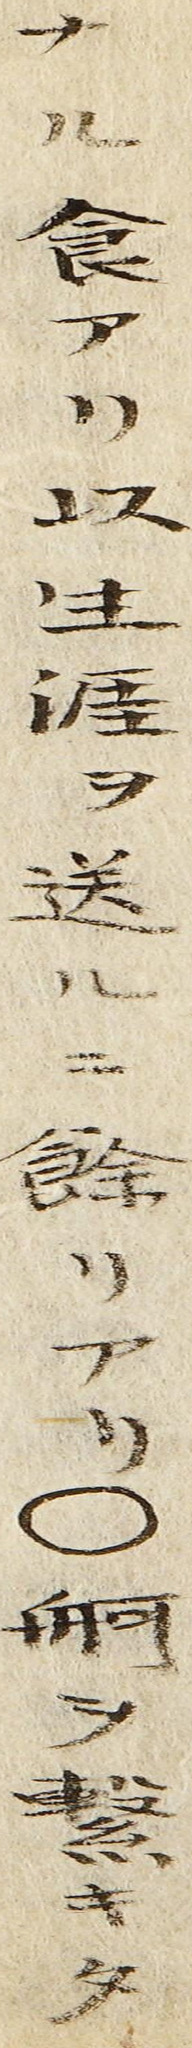ナル食アリ以生涯ヲ送ルニ余リアリ◯舸ヲ繋キタ
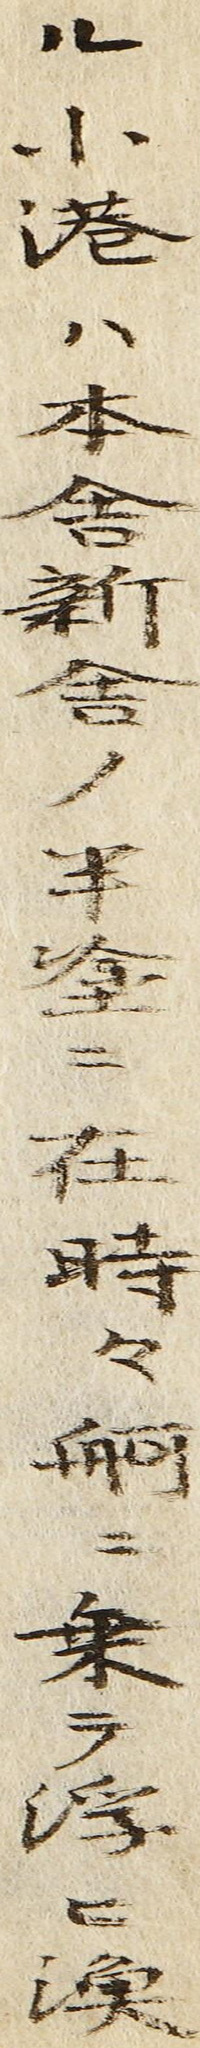ル小港ハ本舎新舎ノ半塗ニ在時々舸ニ乗テ浮ヒ漁
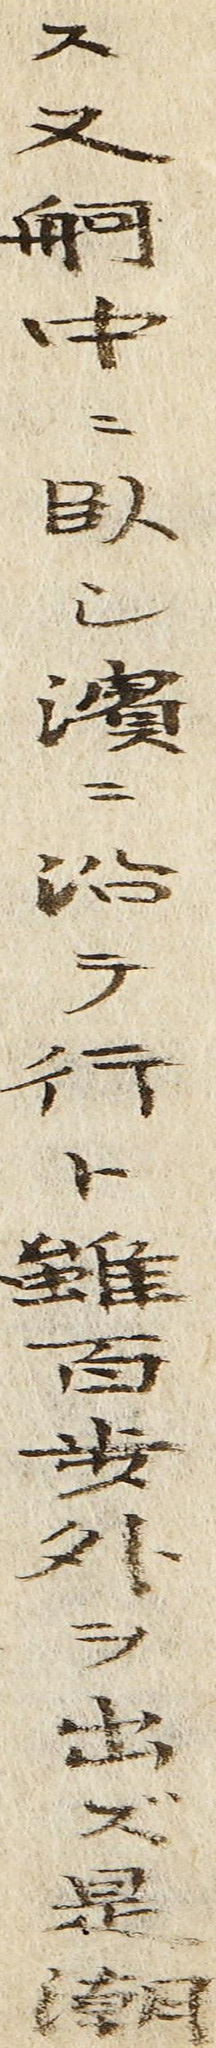ス又舸中ニ臥シ浜ニ沿テ行ト雖百歩外ヲ出ズ是潮
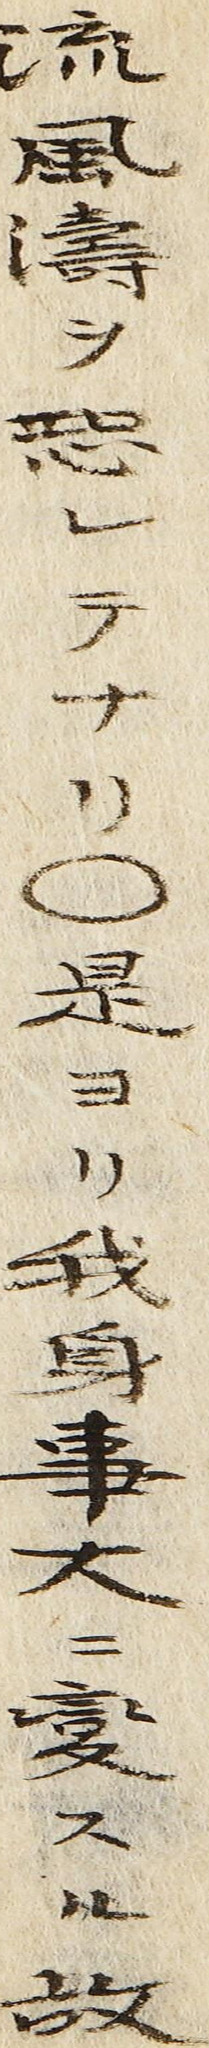流風濤ヲ恐レテナリ◯是ヨリ我身事大ニ変スル故
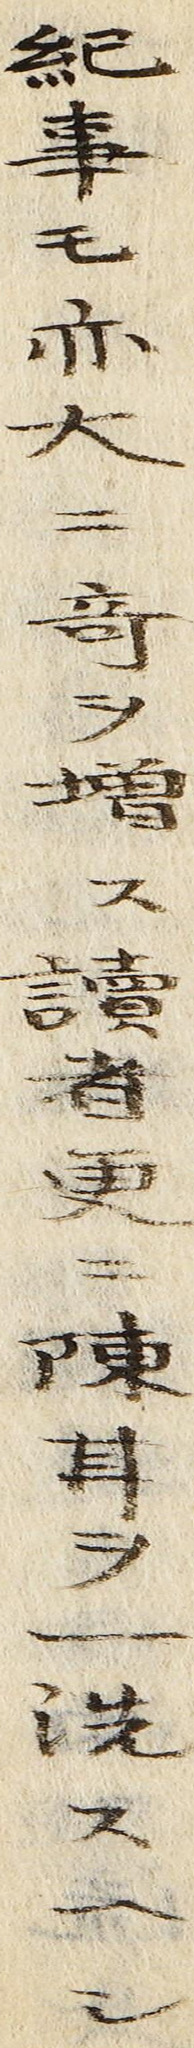紀事モ又大ニ奇ヲ増ス読者更ニ陳耳ヲ一洗スヘシ
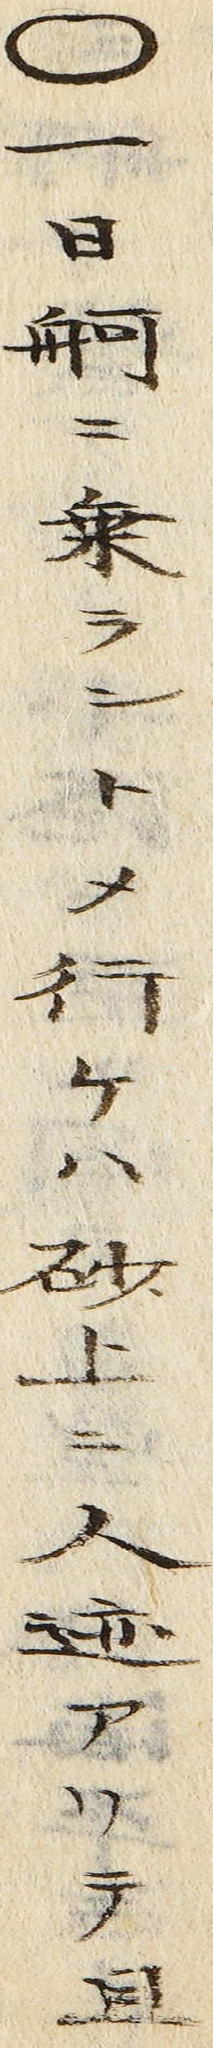◯一日舸ニ乗ラントシテ行ケハ砂上ニ人迹アリテ且
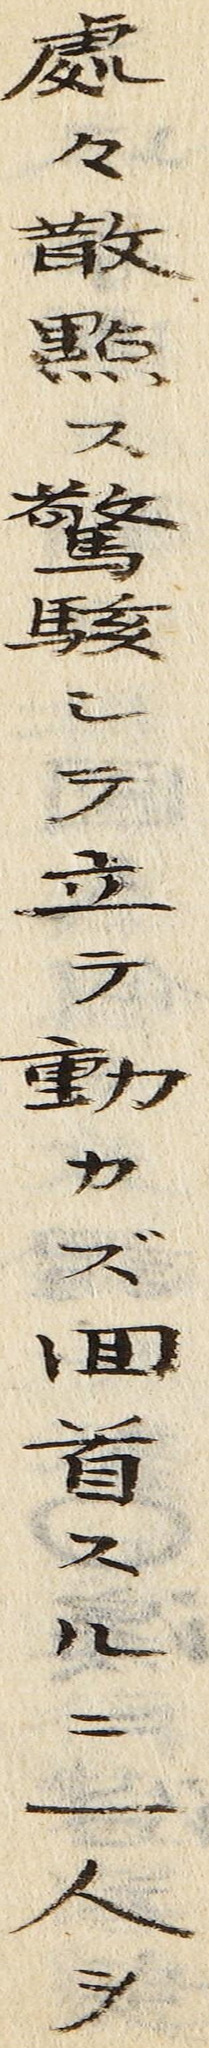処々散点ス驚駭シテ立テ動カズ回首スルニ一人ヲ
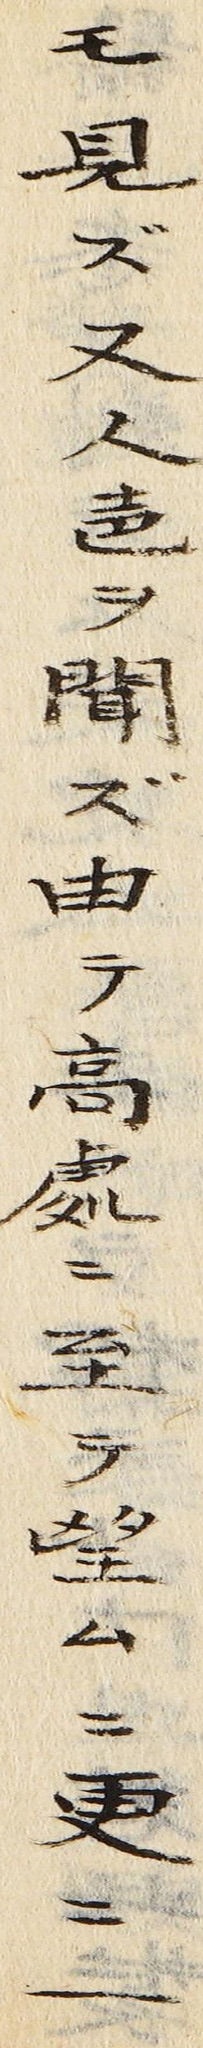モ見ズ又人声ヲ聞ズ由テ高処ニ至テ望ムニ更ニ一
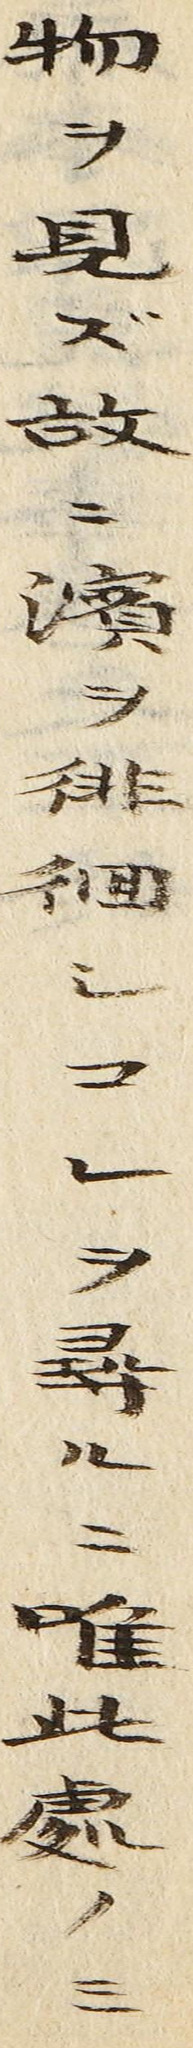物ヲ見ズ故ニ浜ヲ徘徊シコレヲ尋ルニ唯此処ノミ
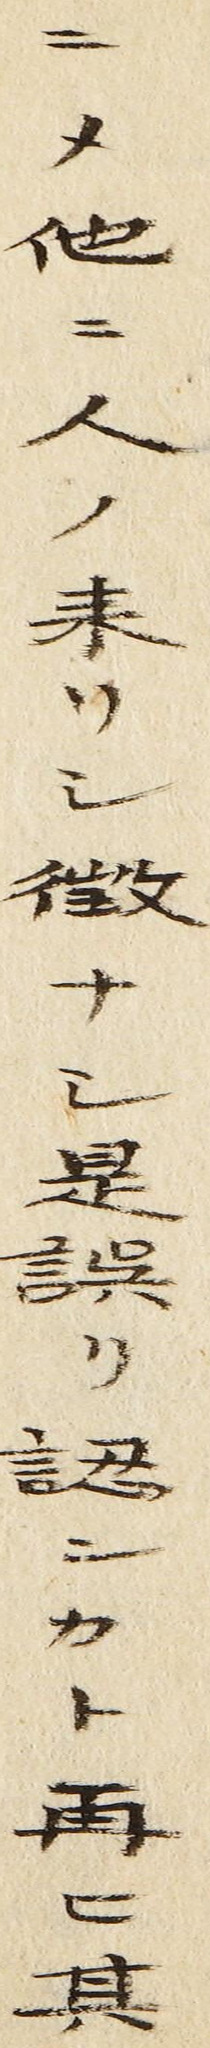ニシテ他ニ人ノ来リシ徴ナシ是誤リ認ンカト再ヒ其
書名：漂流紀事
